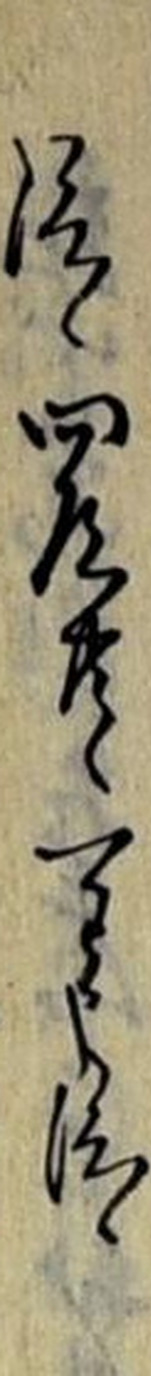渡候問屋共へ可被申渡候
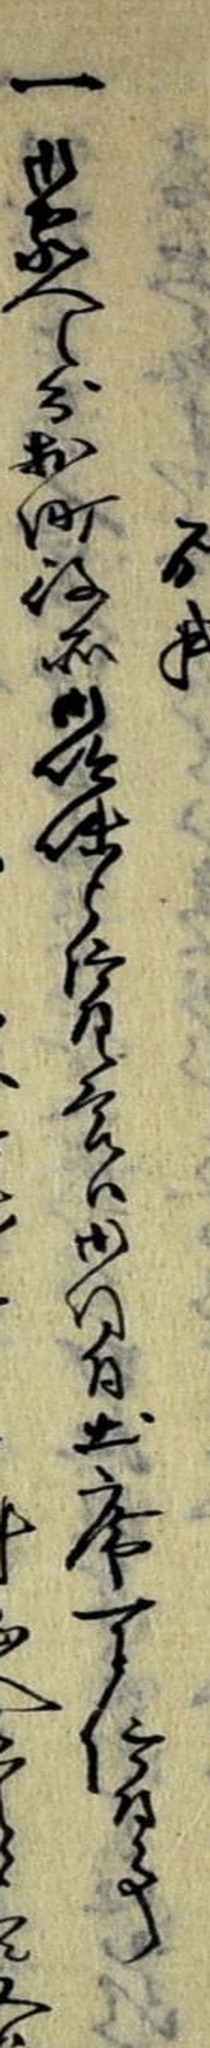一御家人之分於町役所御吟味被仰付候節ハ御目付出席可被仰付事
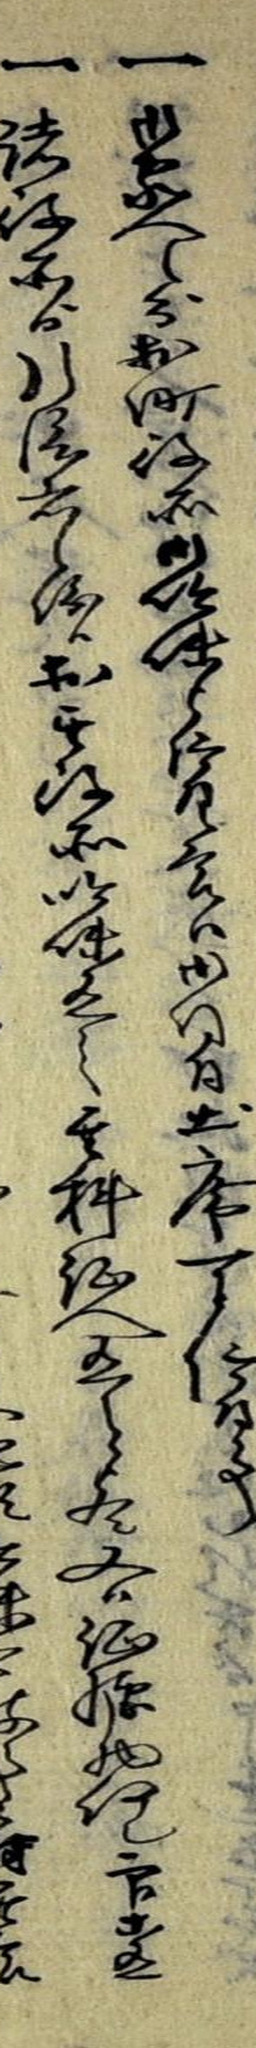一諸役所ゟ引渡者之儀ハ於其役所吟味有之其科証人有之候歟又ハ証拠物何レ印等有
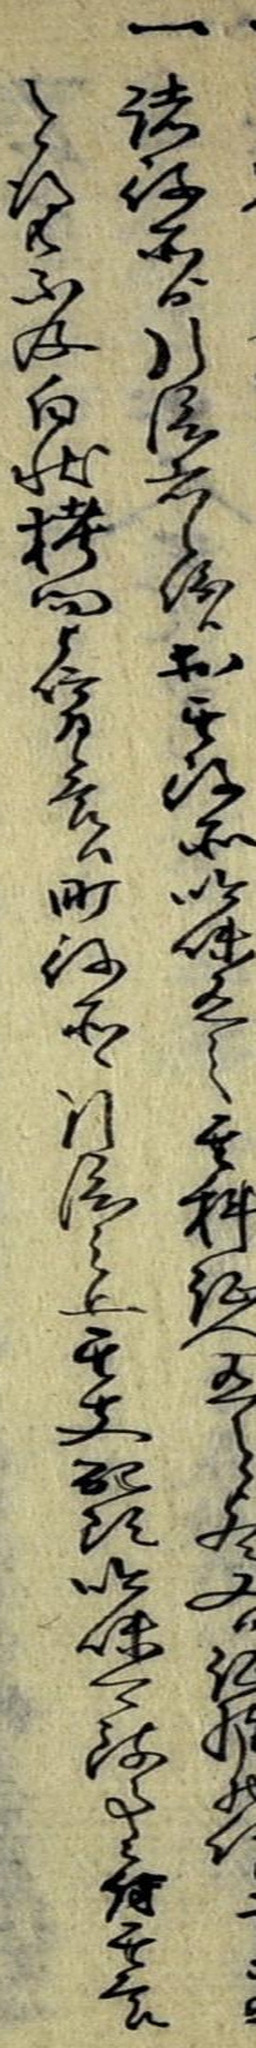之候得共不及白状拷問被仰付候節ハ町役所へ引渡之上其支配頭吟味可致事ニ付其節
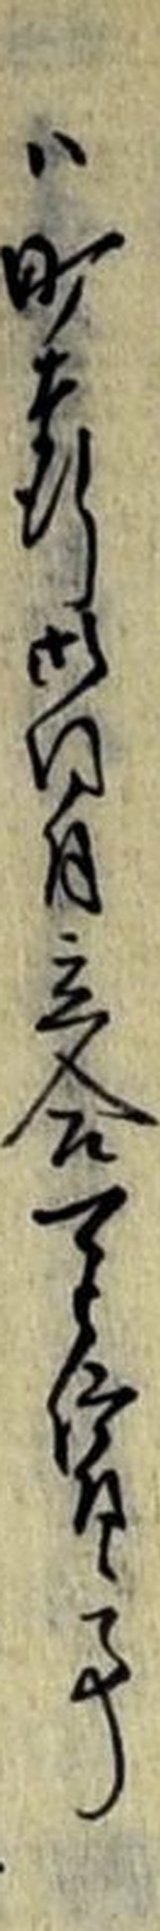ハ町奉行御目付立合可被仰付候事
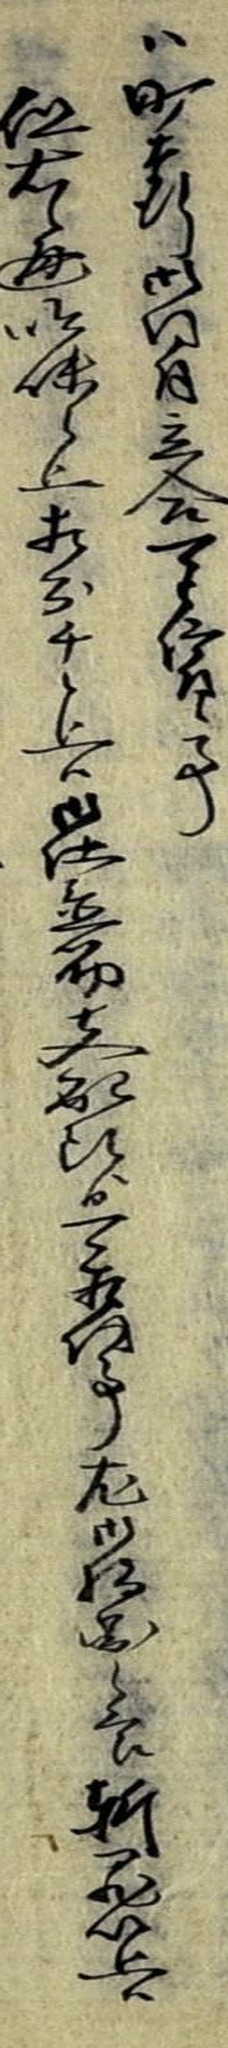但右之通吟味之上相分チ候上ハ御仕置筋支配頭ゟ可相伺事尤御指図之節斬罪以上ハ
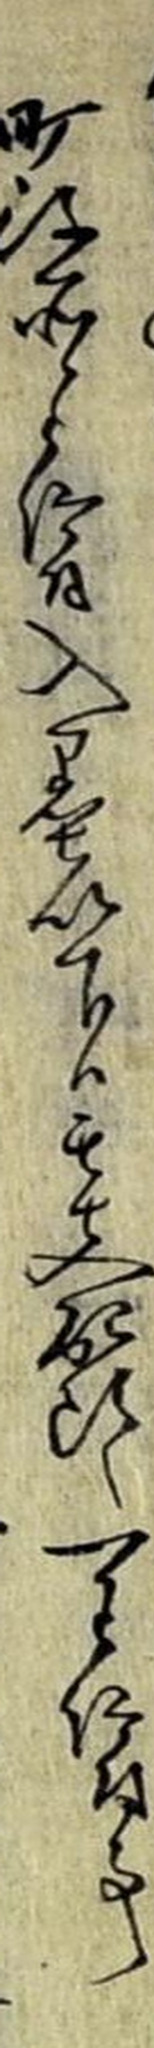町役所へ被仰付入墨以下ハ其支配頭へ可被仰付事
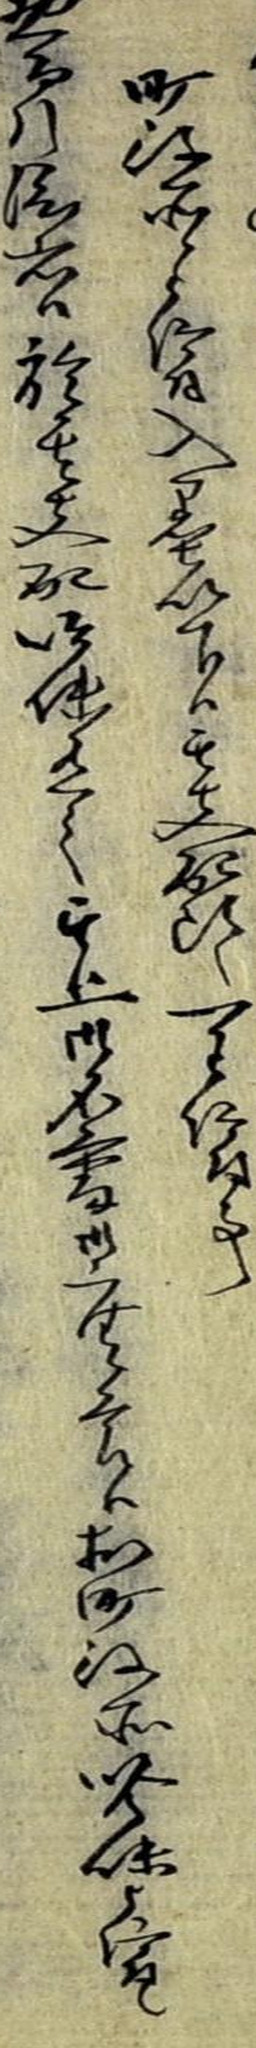一惣而引渡者ハ於其支配吟味有之其上御普請御座候節ハ於町役所吟味被仰付候
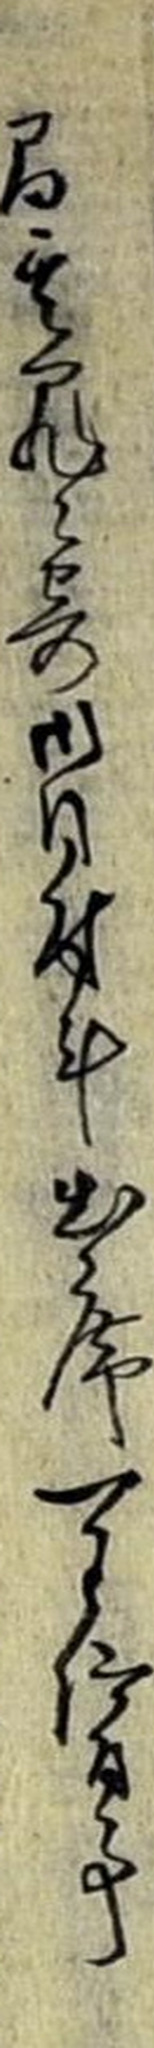間其罪ニ寄御目付斗出席可被仰付事
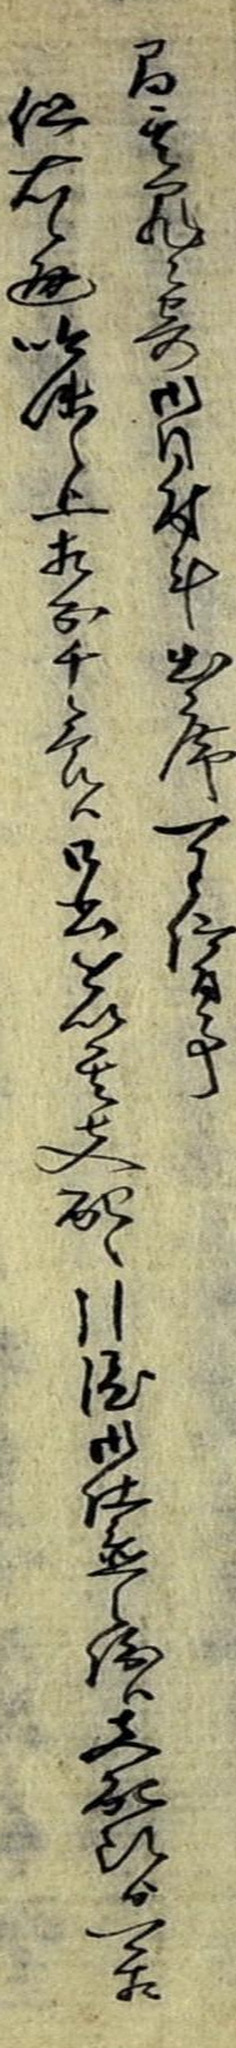但右之通吟味之上相分チ候節ハ口書を以其支配へ引渡御仕置之儀ハ支配頭ゟ可相
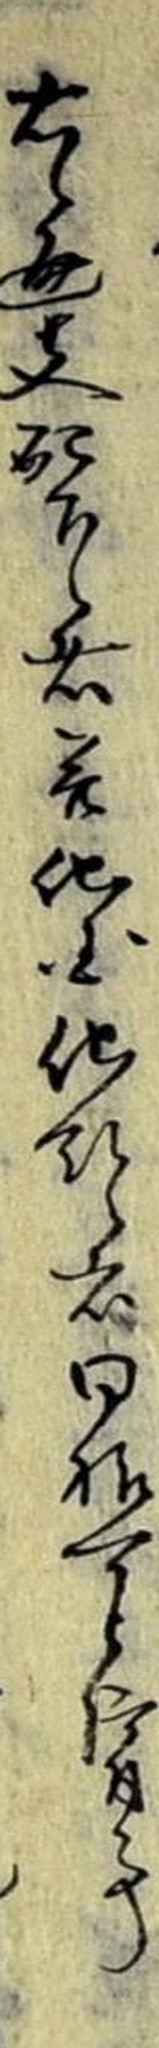右之通支配下之者并他国他領之者同様可被仰付事
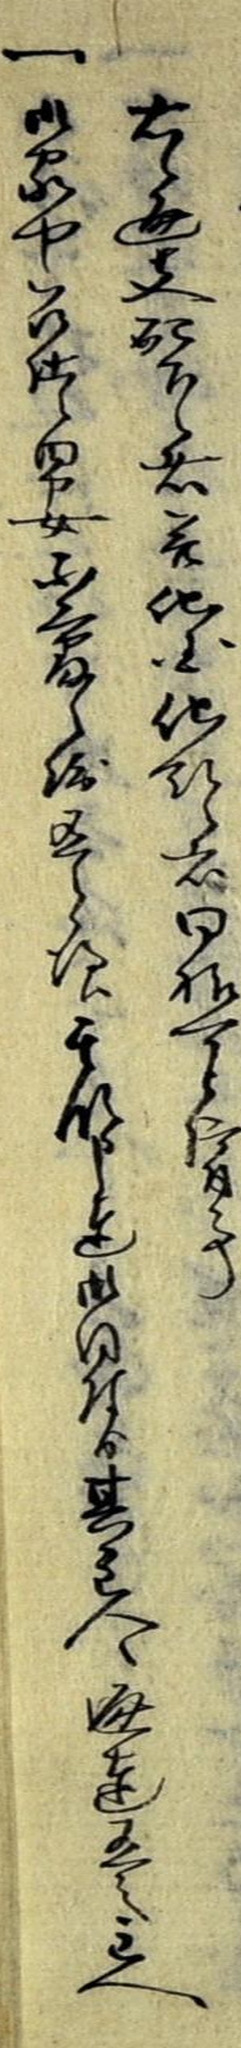一御家中召仕候男女不審之儀有之候得ハ其段申達御目付ゟ其主人へ通達有之主人

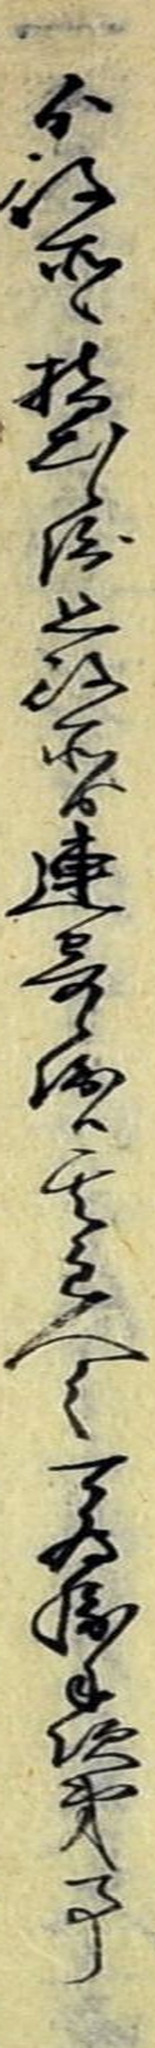ゟ役所へ指出候儀且役所ゟ連寄候儀ハ其主人之可為勝手次第事
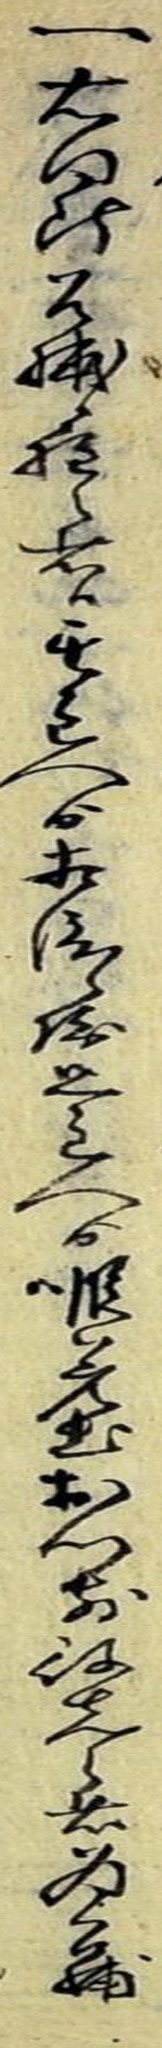一右同断召捕候程之者ハ其主人ゟ相渡候儀且主人ゟ暇差出於門前役先之者為召捕
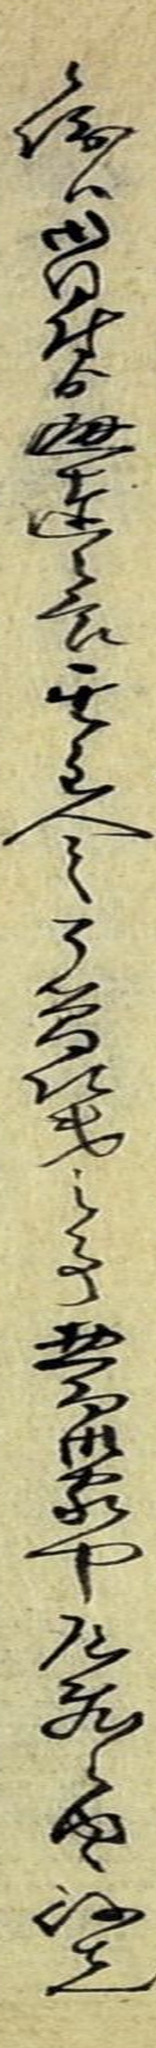候儀ハ御目付ゟ通達之節其主人之了簡次第之事惣而御家中屋敷之内へ役先
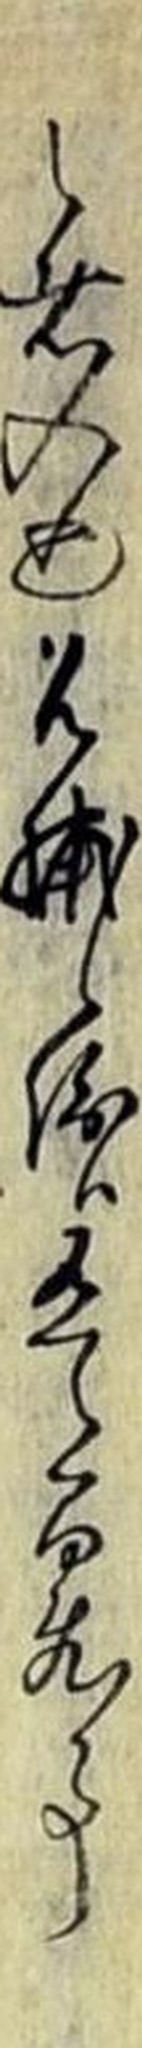之者入込召捕候儀ハ有之間敷事
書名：命令之部 三
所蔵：福井県文書館 Fukui Prefectural Archives
